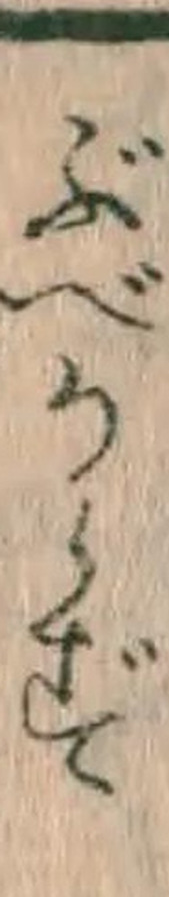ぶべからず
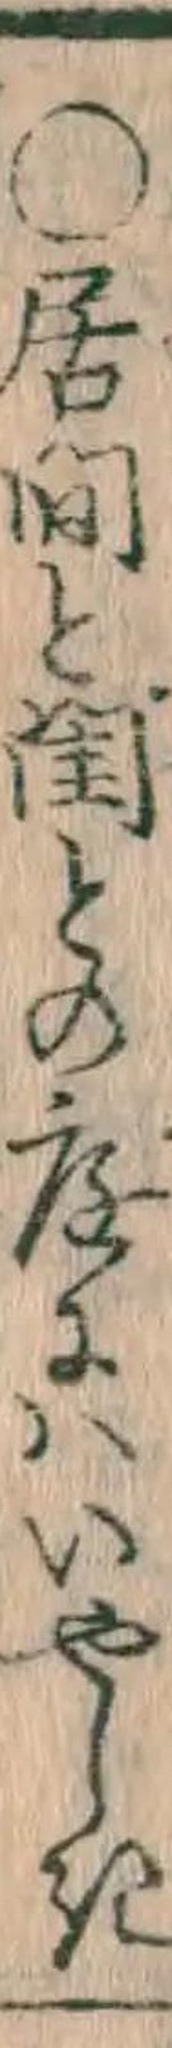○居間と閨との庭にはいやしき
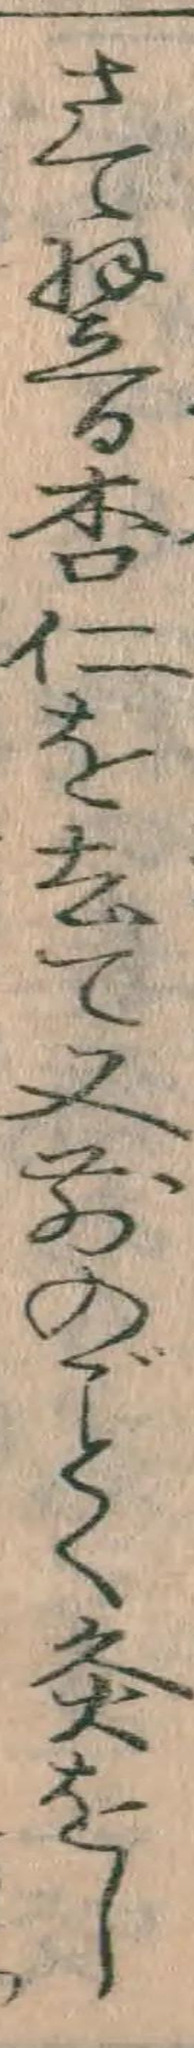さて翌日杏仁を去て又前のごとく灸をし
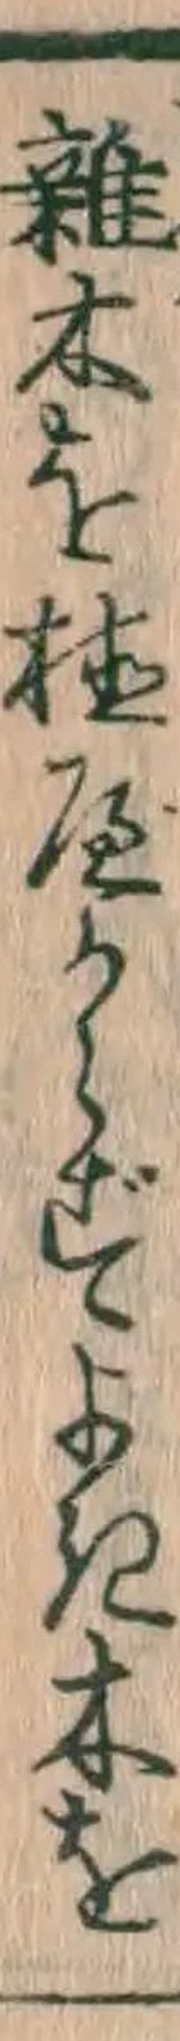雑木を植べからずよき木を
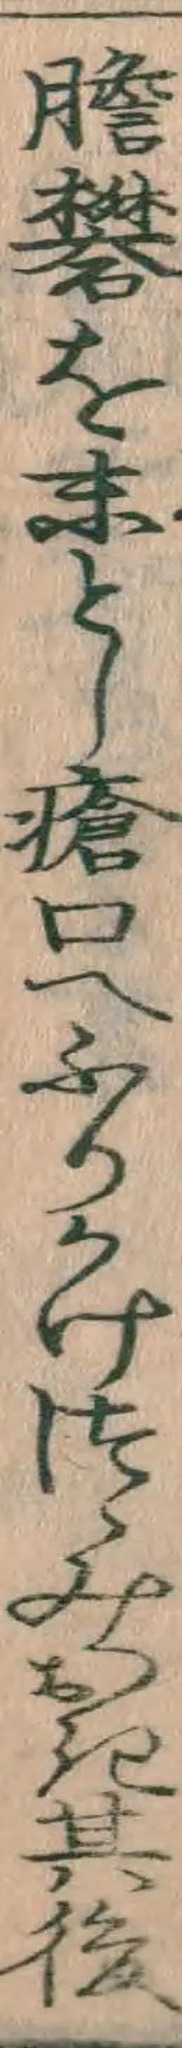膽礬を末とし瘡口へふりかけつゝみおき其後
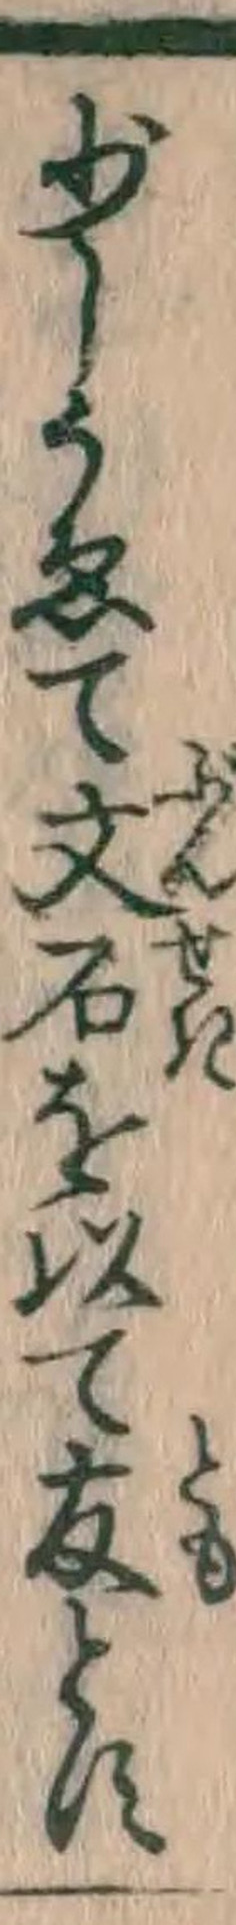少しうゑて文石を以て友とす
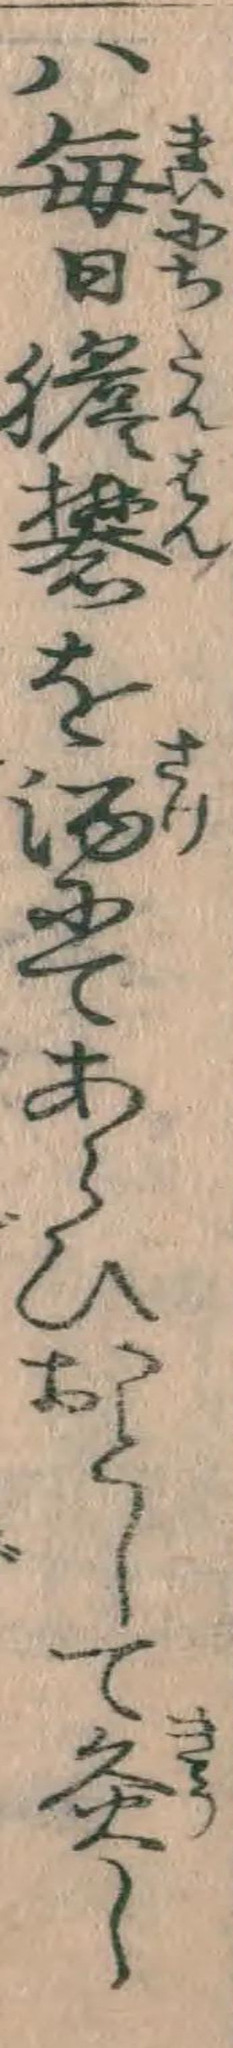は毎日膽礬を酒にてあらひおとして灸し
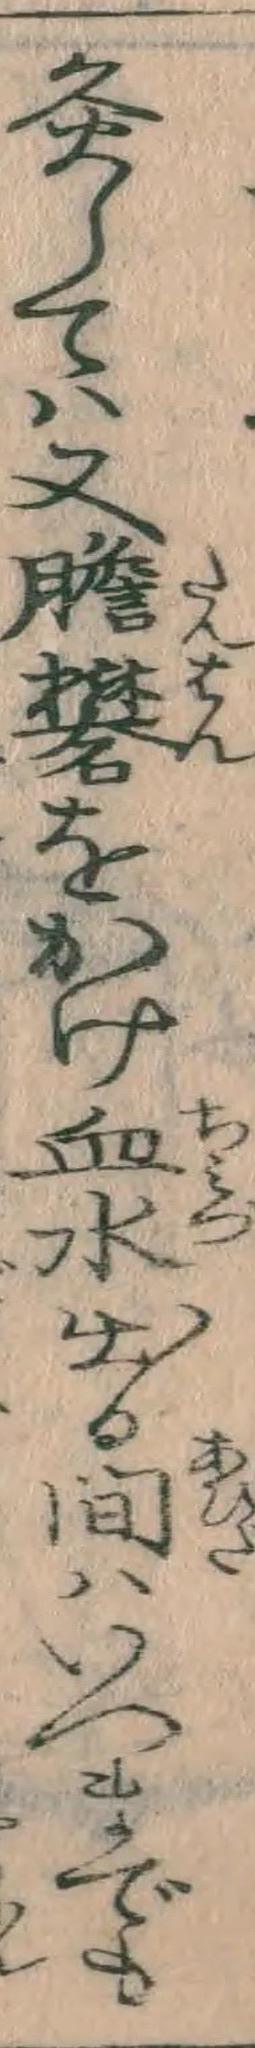灸しては又膽礬をかけ血水出る間はいつまでも
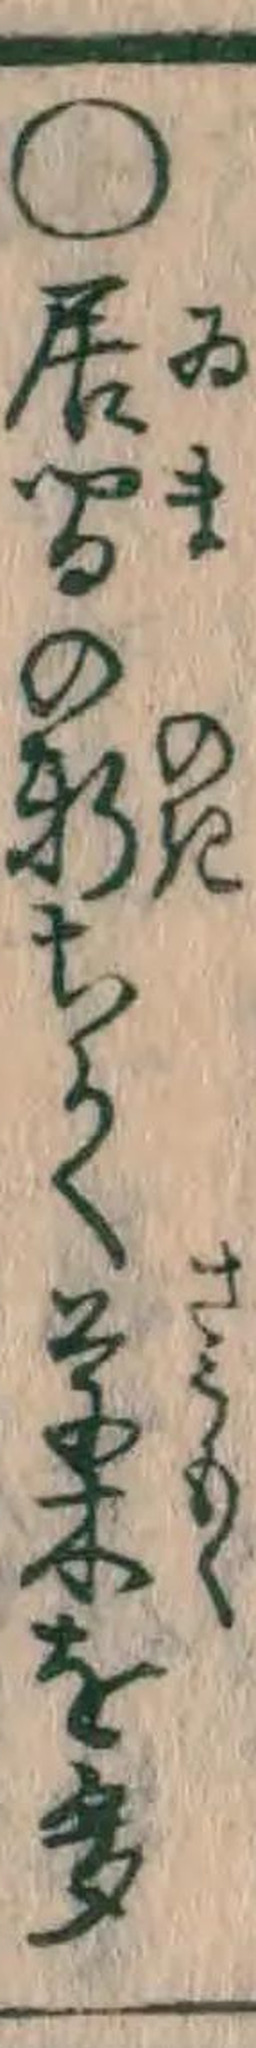○居間の軒ちかく草木を多
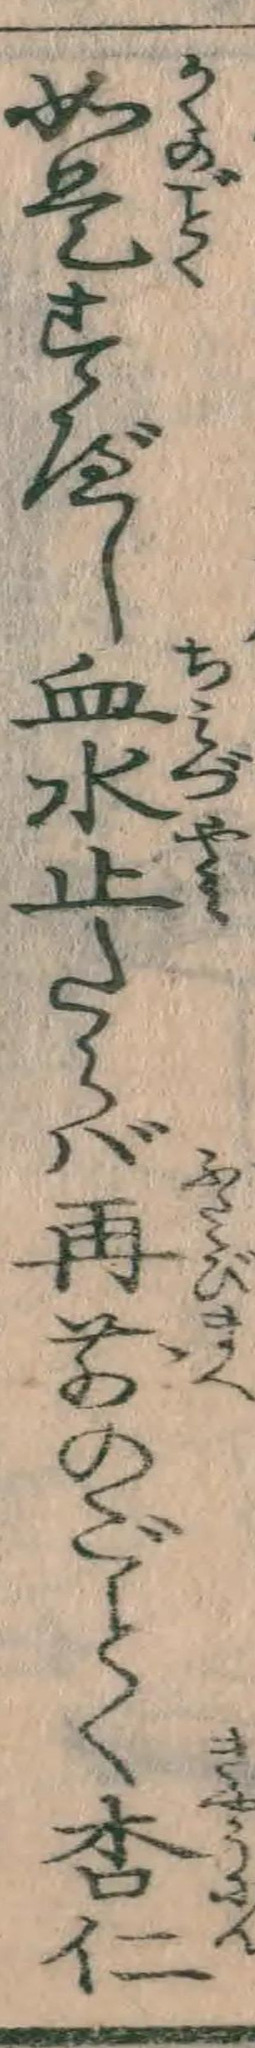如是すべし血水止たらば再前のごとく杏仁
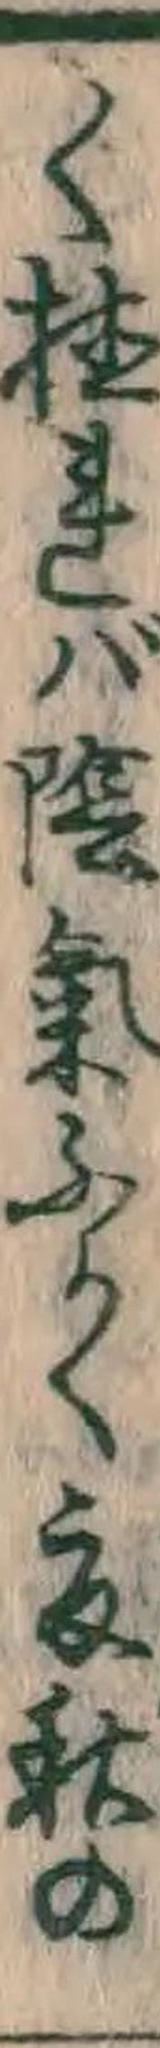く植れば陰気ふかく夏秋の
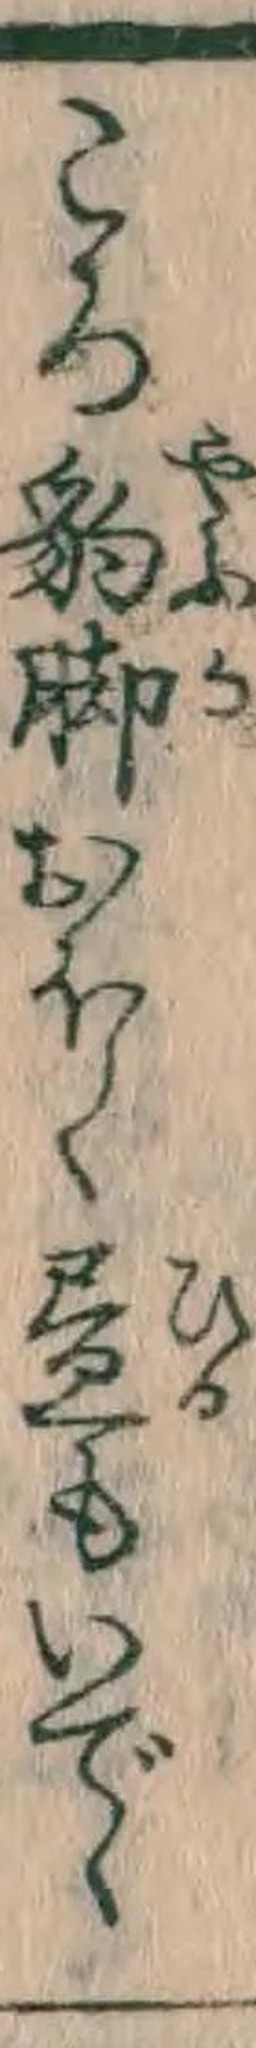ころ豹脚おほく昼もいでゝ
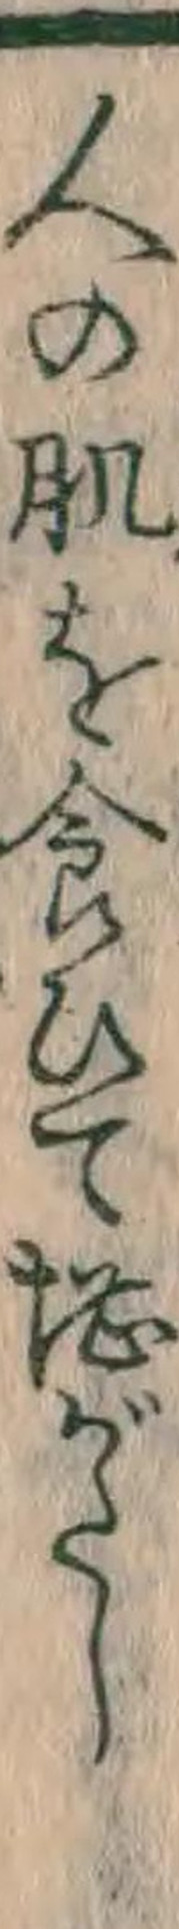人の肌を食ひて堪がたし
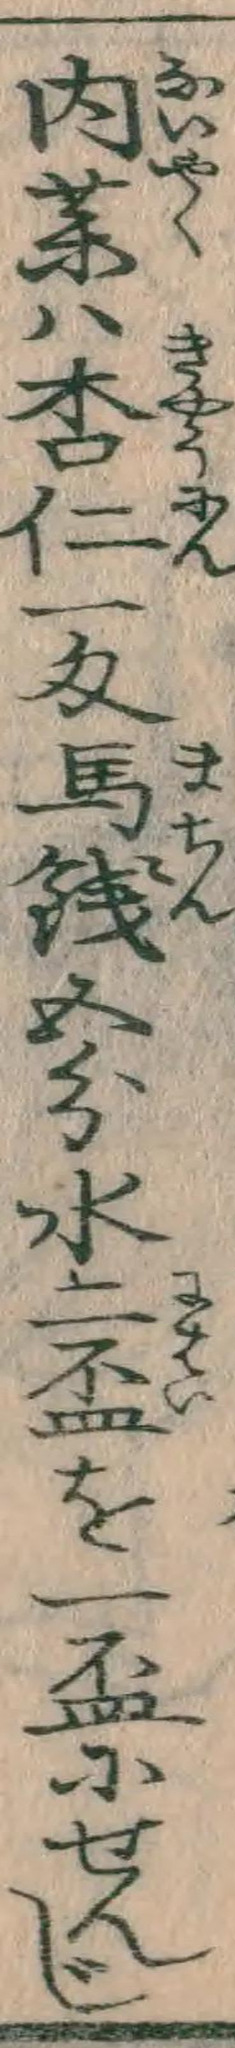内薬は杏仁一匁馬銭五分水二盃を一盃にせんじ
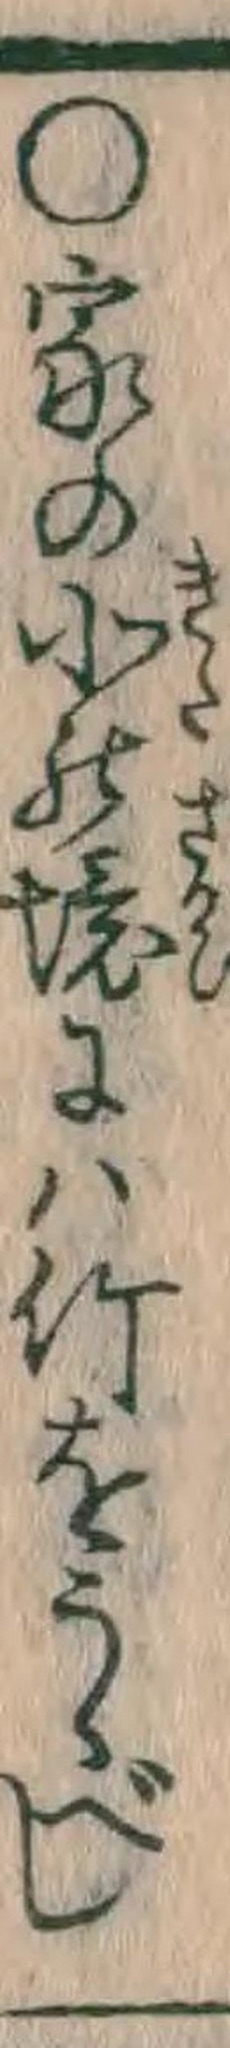○家の北の境には竹をうゝべし
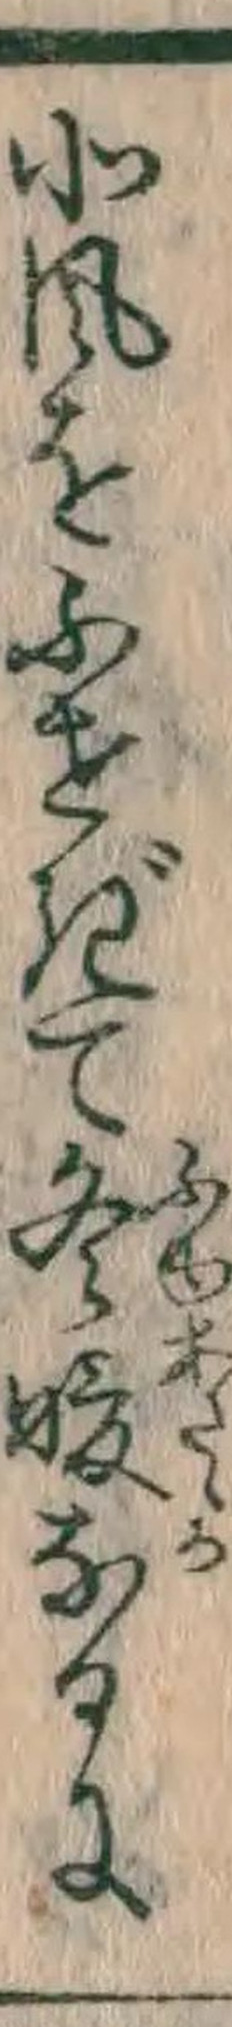北風をふせぎて冬暖なるに
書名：広益秘事大全 3巻. [3]
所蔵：国立国会図書館 National Diet Library, JAPAN
